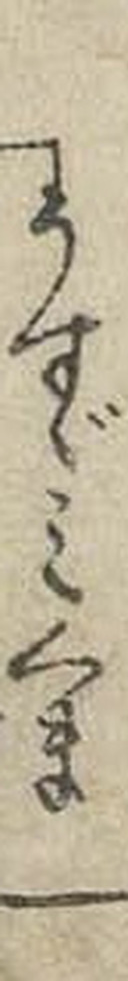うすゞみくま
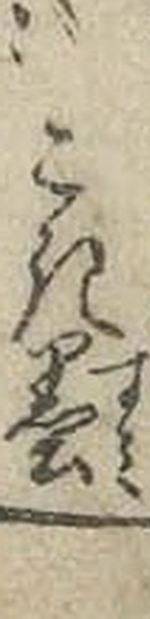こき墨
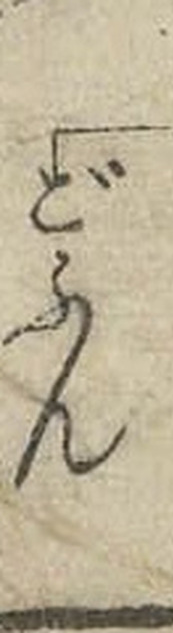ごふん
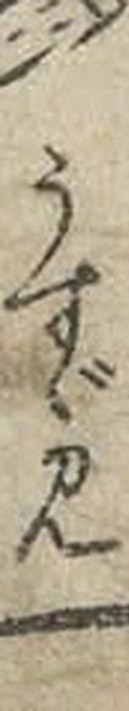うすゞみ
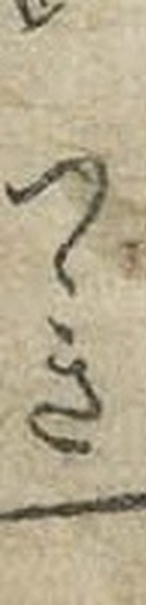つゝき

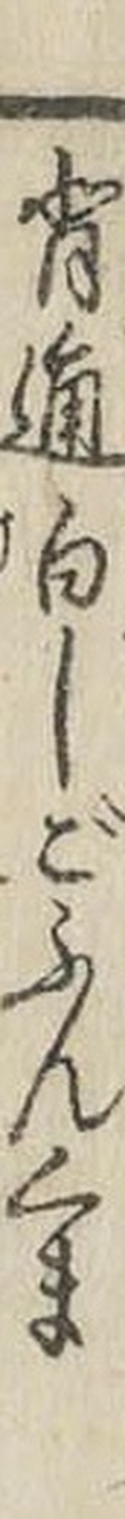背通白しごふんくま
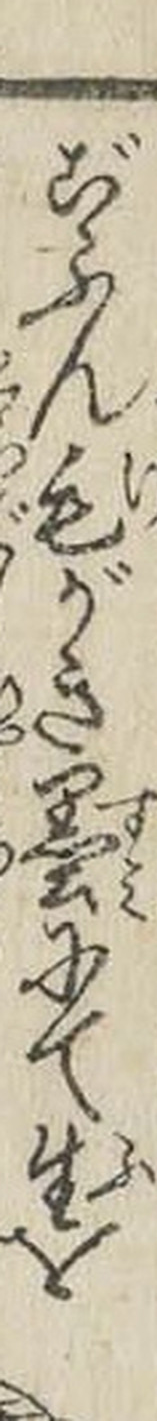ごふん毛がき墨にて生を
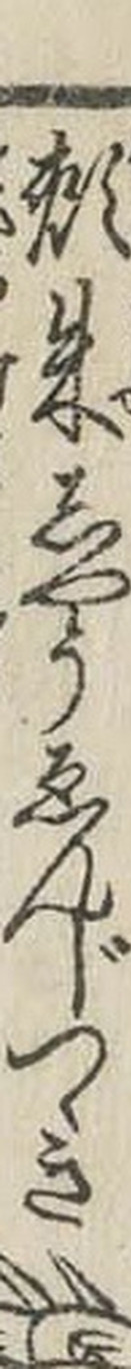頬朱しやうゑんじつゝき
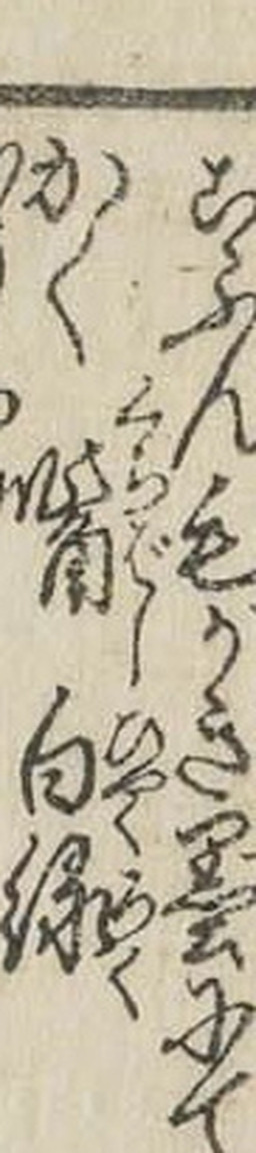かく嘴白緑
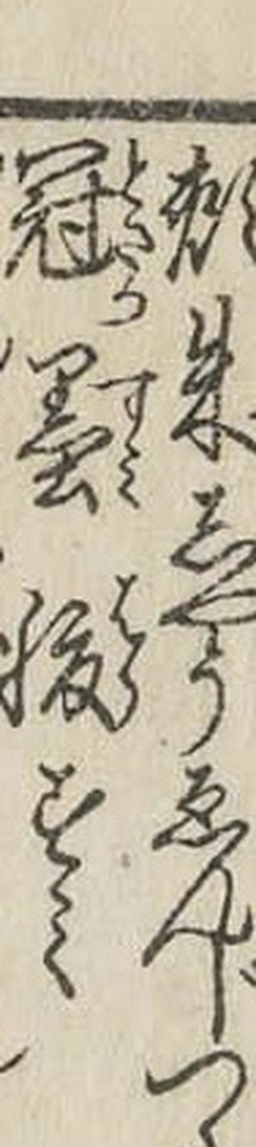冠墨腹すみ
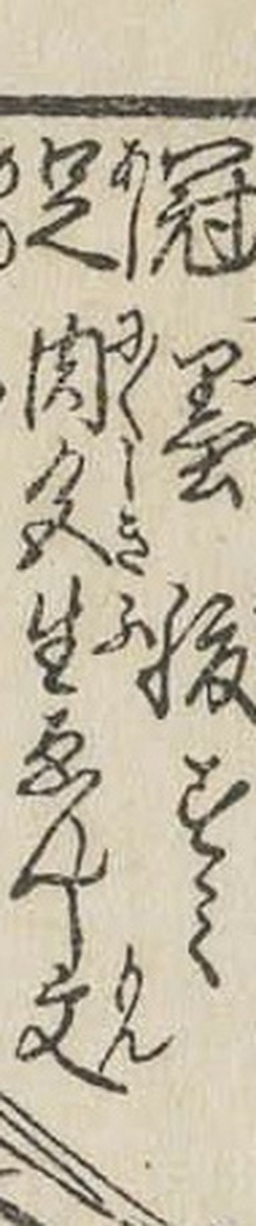足肉色生ゑんし文
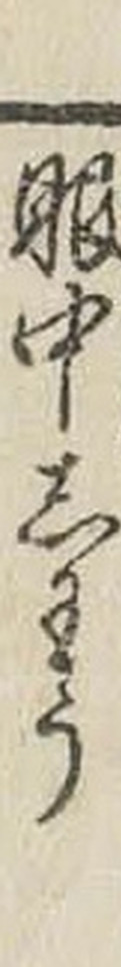眼中しわう
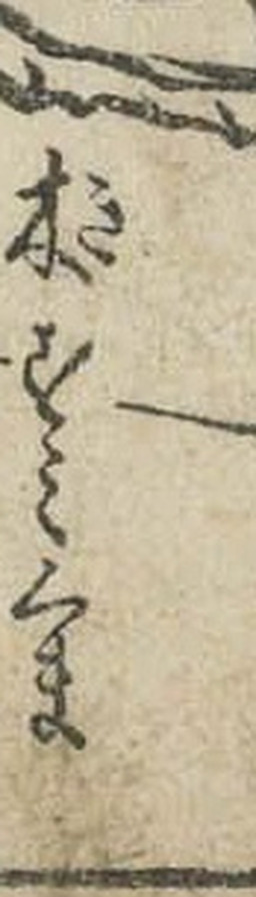木すみくま
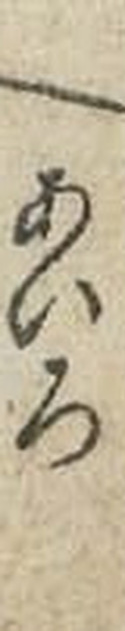あいろ
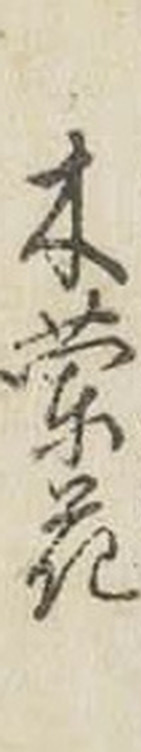木蘭花
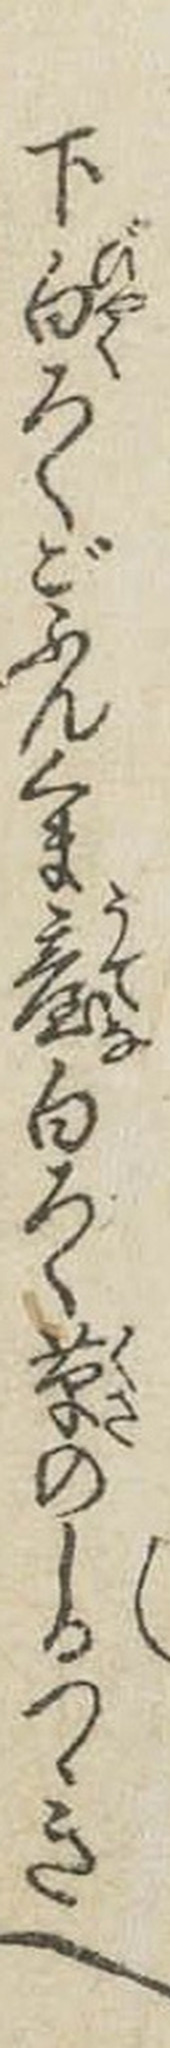下白ろくごふんくま台白ろく草のしるつゝき
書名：絵本写宝袋 9巻 8之巻
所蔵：東京学芸大学教育コンテンツアーカイブ
